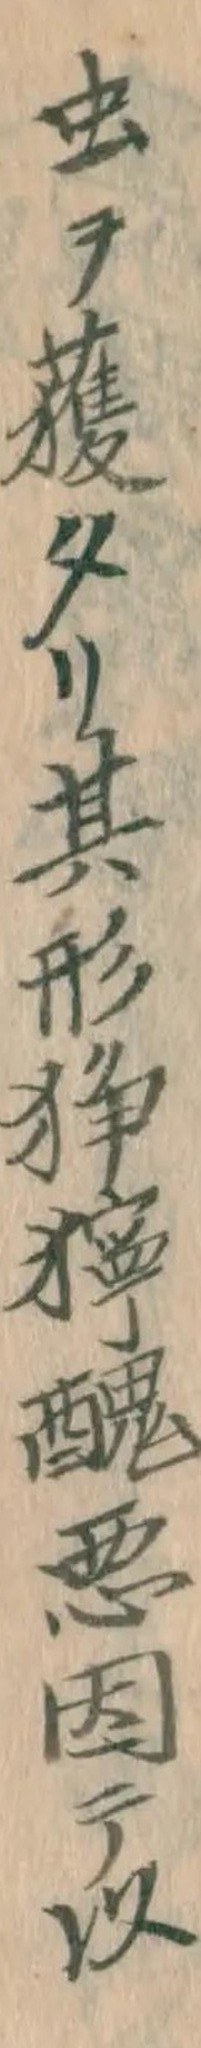虫ヲ獲タリ其形狰獰醜悪因テ以
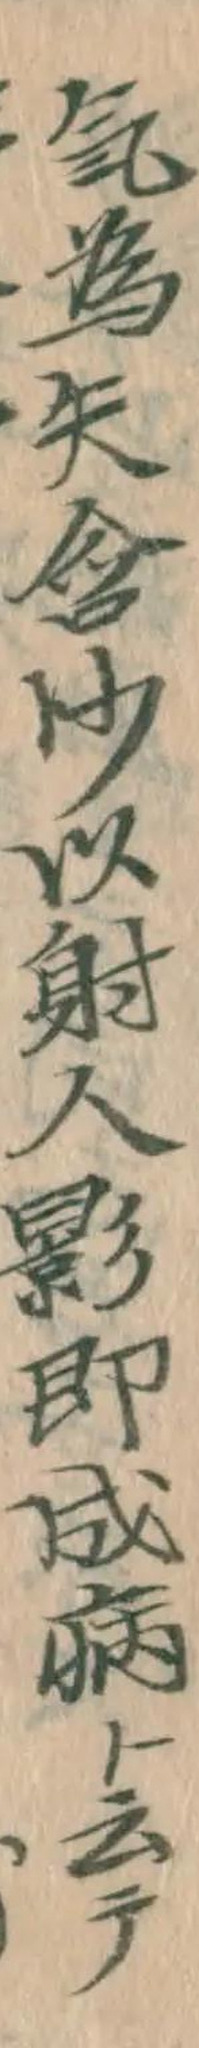気為矢含沙以射人影即成病ト云テ
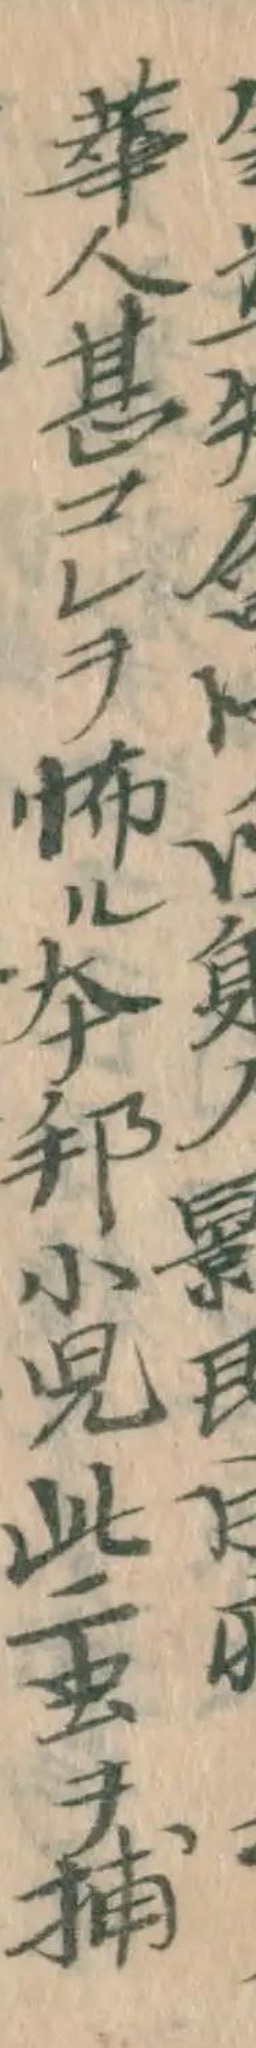華人甚コレヲ怖ル本邦小児此二虫ヲ捕
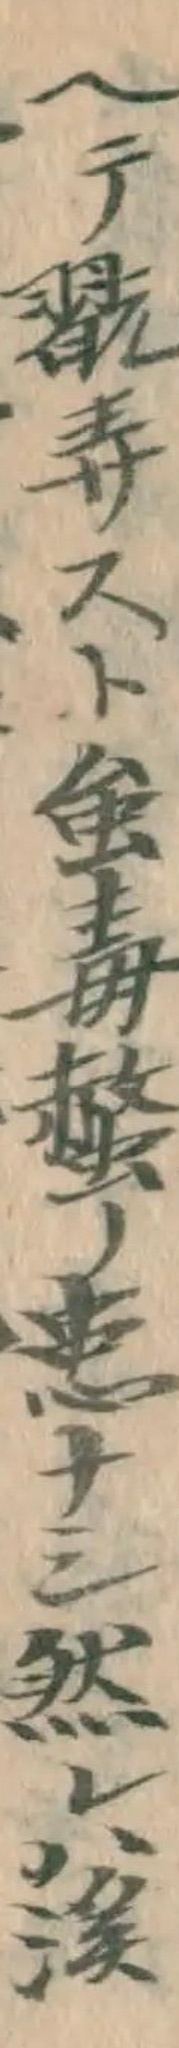ヘテ翫弄スト虽毒螫ノ患ナシ然レハ溪
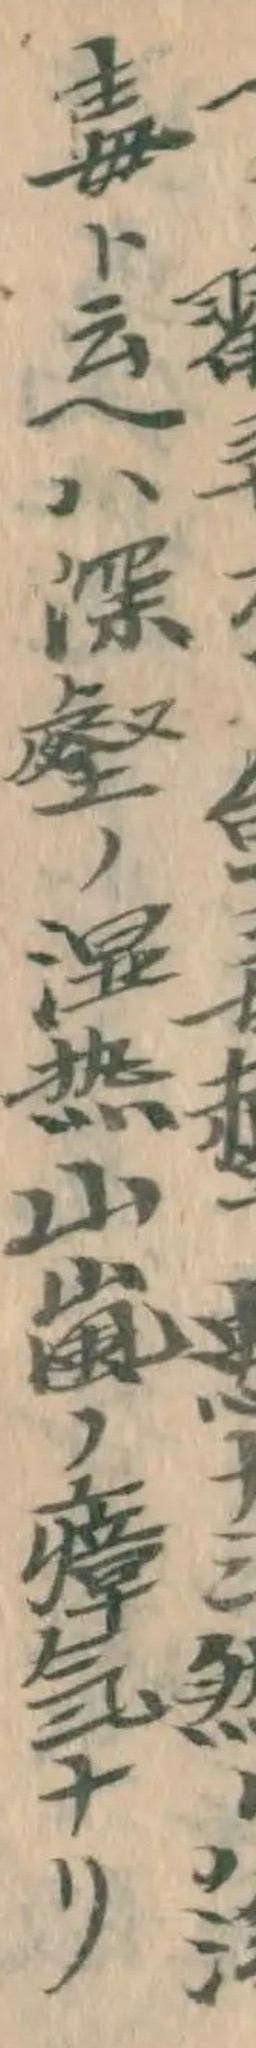毒ト云ヘハ深壑ノ湿熱山嵐ノ瘴気ナリ

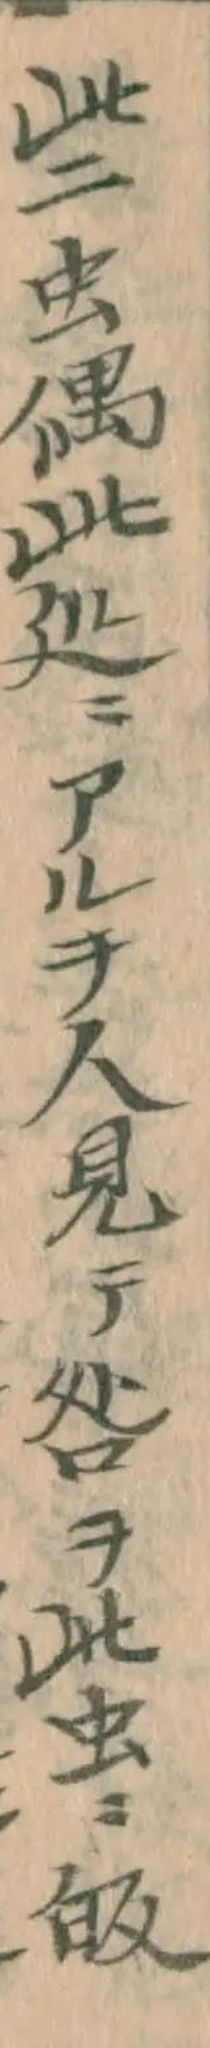此二虫偶此処ニアルヲ人見テ咎ヲ此虫ニ皈
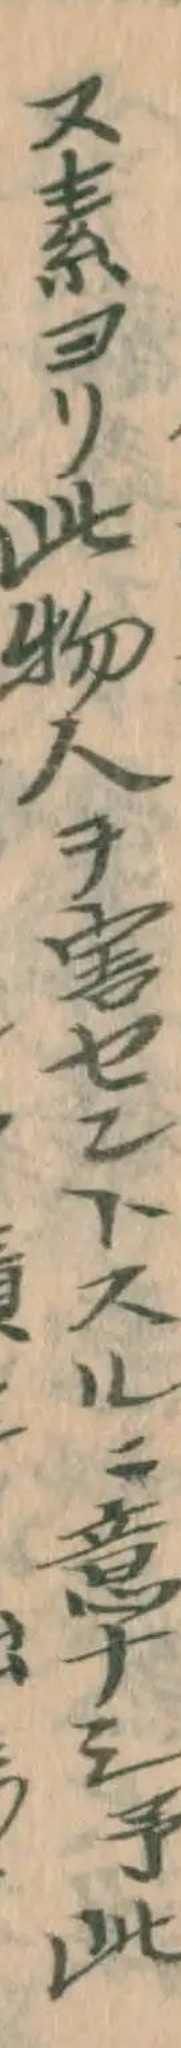ス素ヨリ此物人ヲ害セントスルニ意ナシ予此
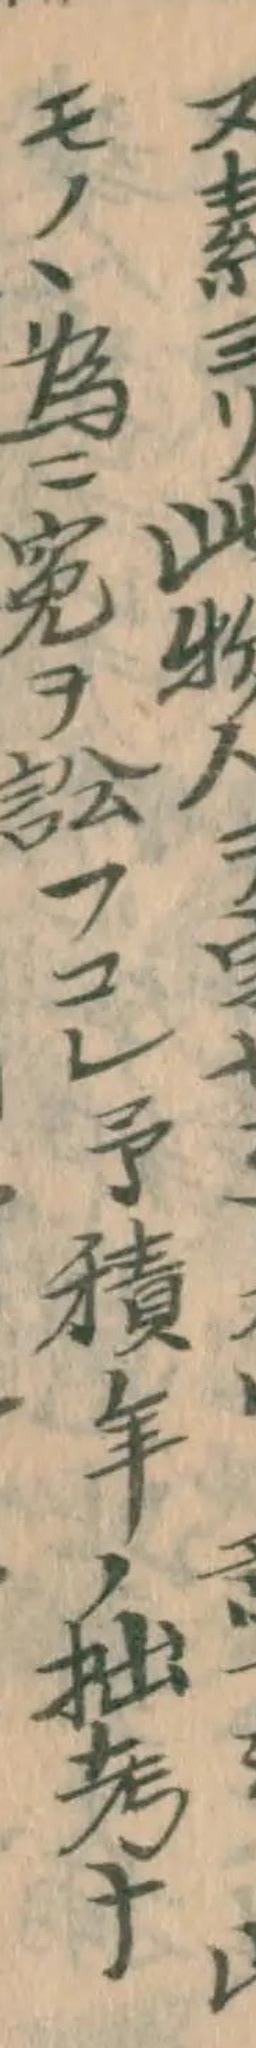モノヽ為ニ冤ヲ訟フコレ予積年ノ拙考ナ
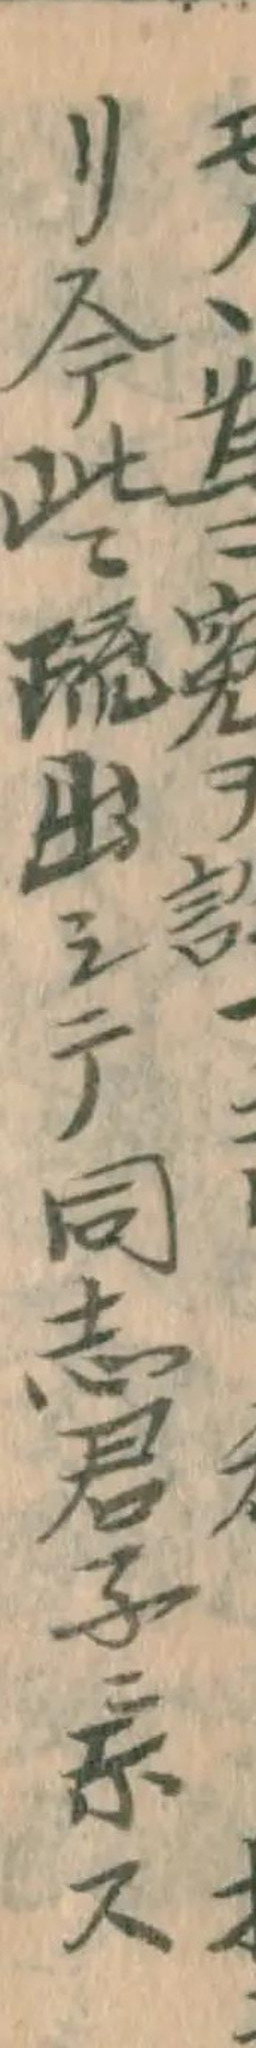リ今此ニ疏出シテ同志君子ニ示ス
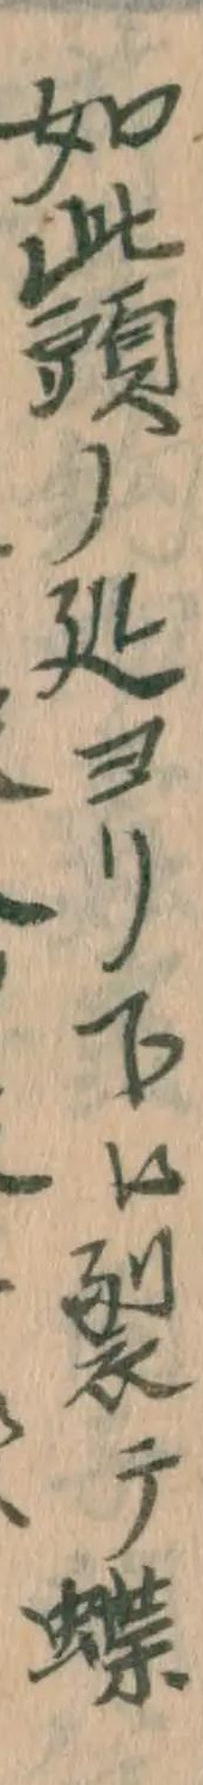如此頭ノ処ヨリ下裂テ蝶
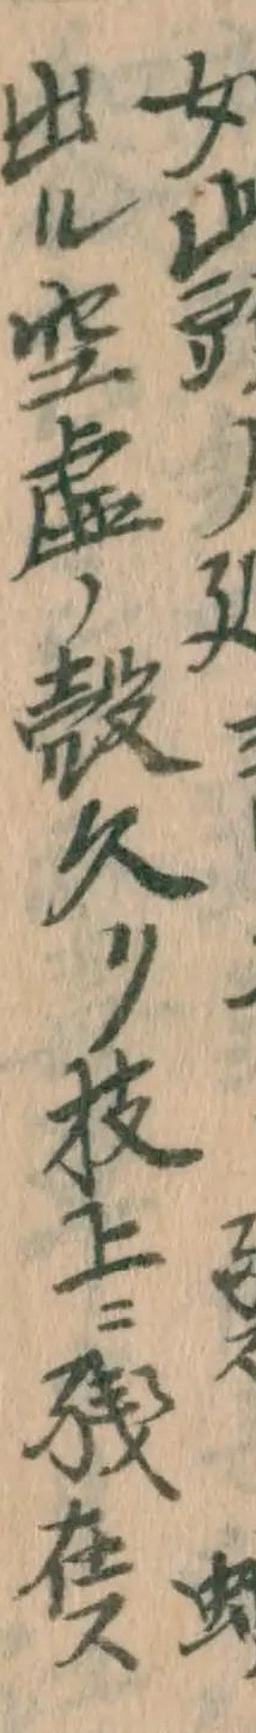出ル空虚ノ殻久ク枝上ニ残存ス
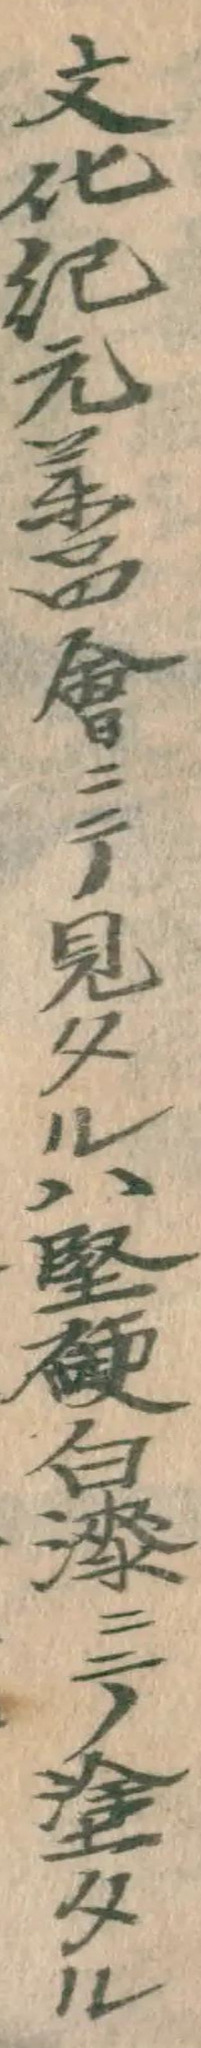文化紀元薬品會ニテ見タルハ堅硬白漆ニテ塗タル
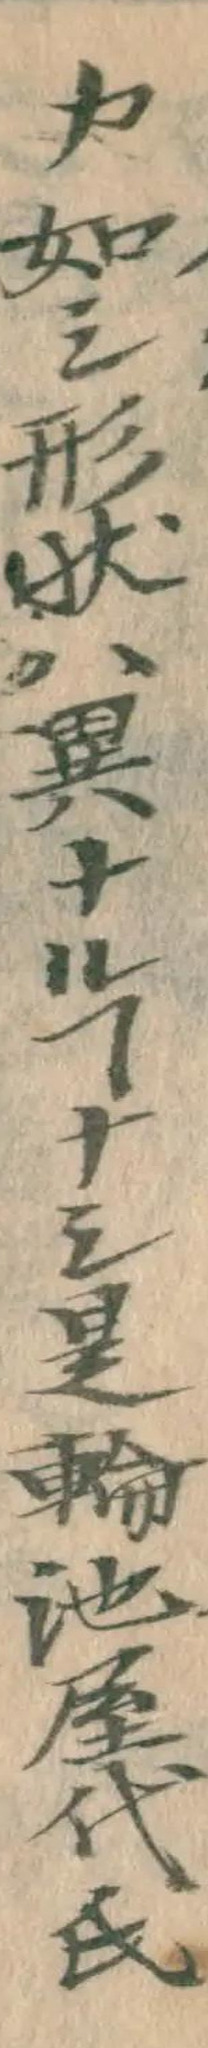カ如シ形状ハ異ナルコトナシ是輪池屋代氏
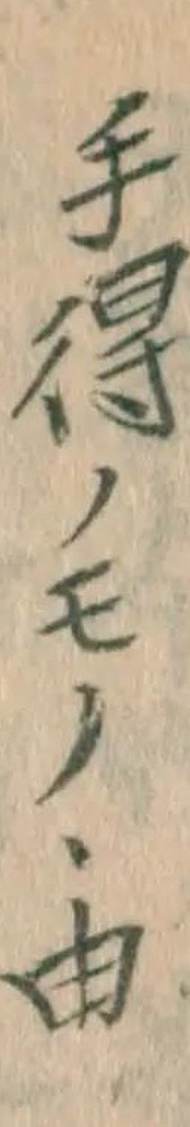手得ノモノヽ由

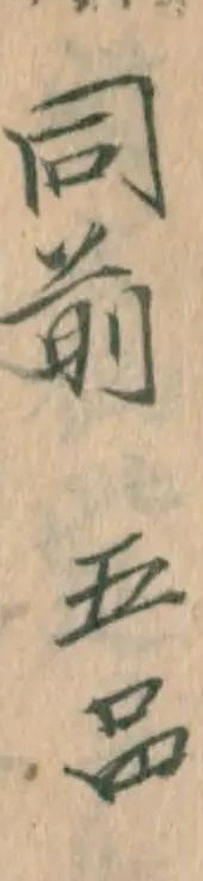同前五品
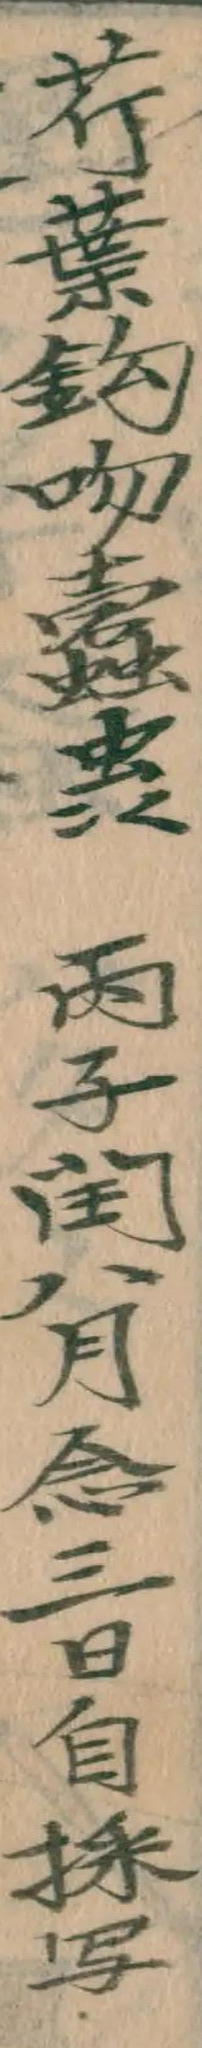芹葉鈎吻蠧蟲丙子閏八月念三日自採写之
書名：千蟲譜 3巻. [1]
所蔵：国立国会図書館 National Diet Library, JAPAN
